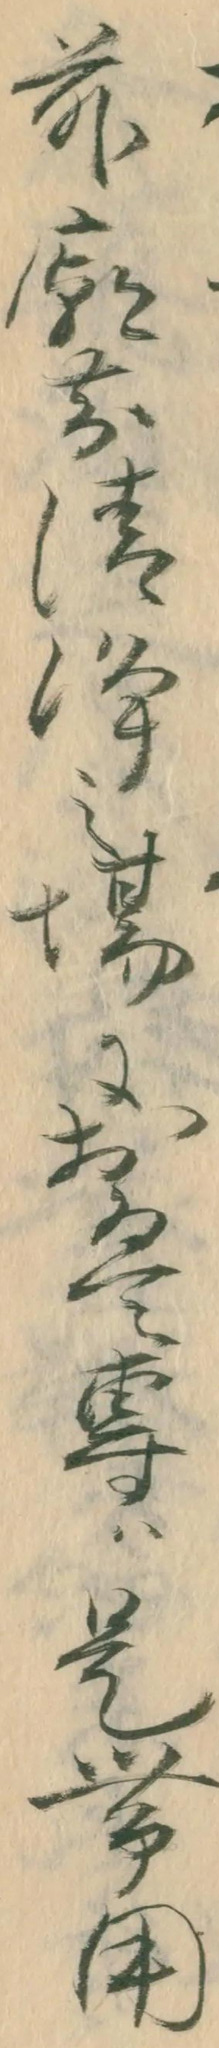前廟前清浄之場におゐて専は是帯用

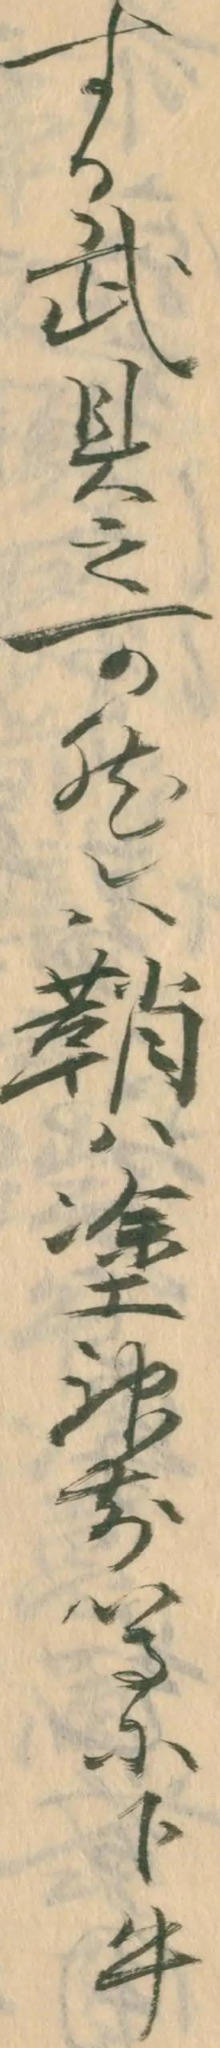する武具之可然れは鞘は塗神前等に下牛
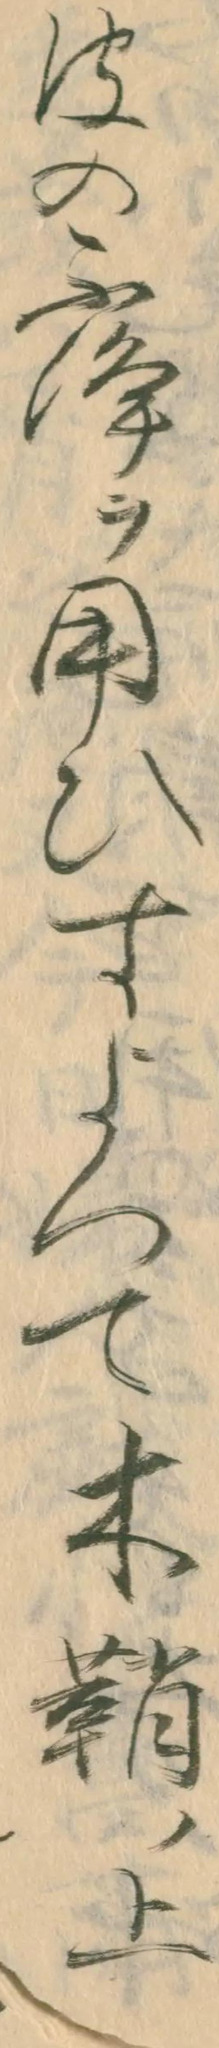皮の不浄を用ひすよつて木鞘の上
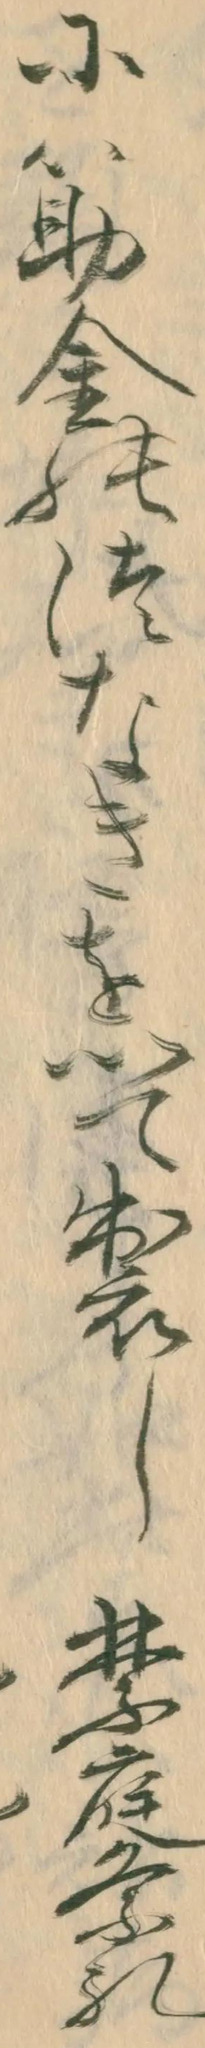に筋金のつなきを以て製し禁庭祭礼
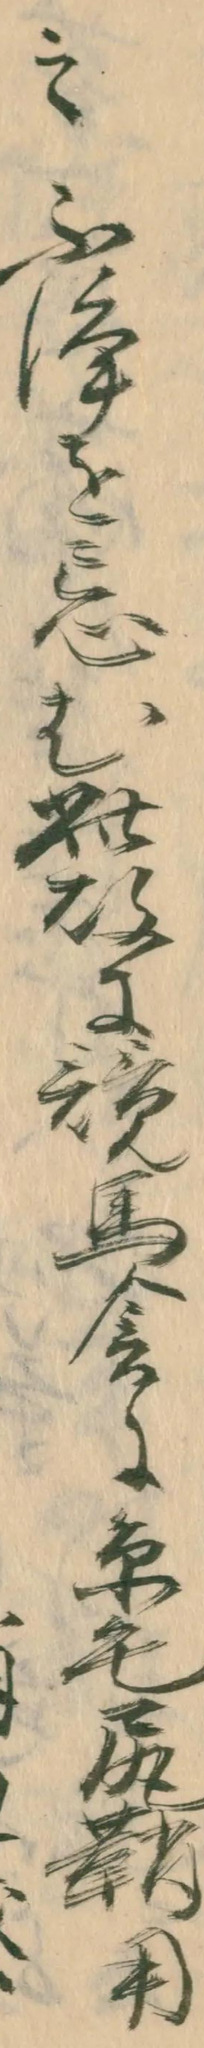之不浄を忌む此故に競馬会に糸毛尻鞘用
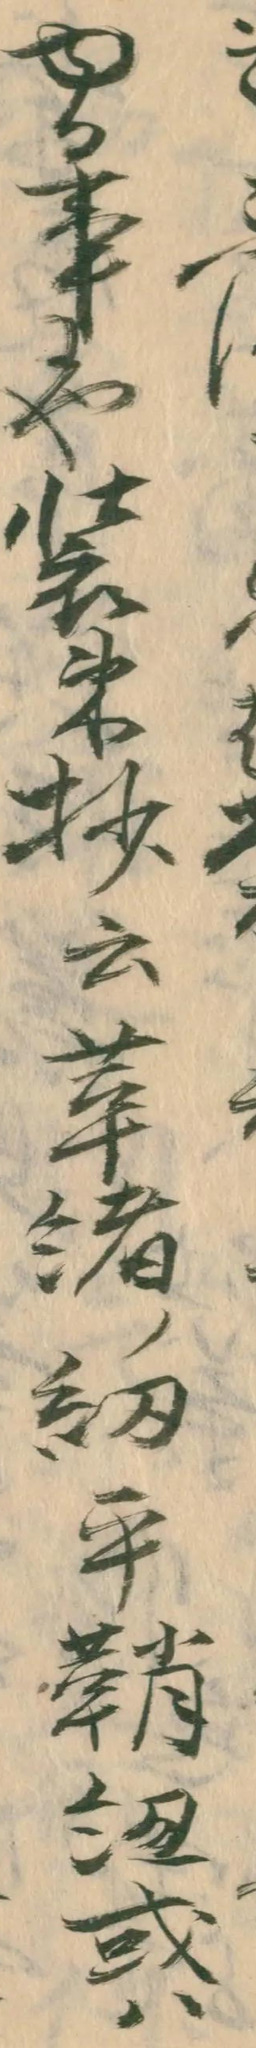ゆる事にや装束抄云革緒の紐平鞘紐或は
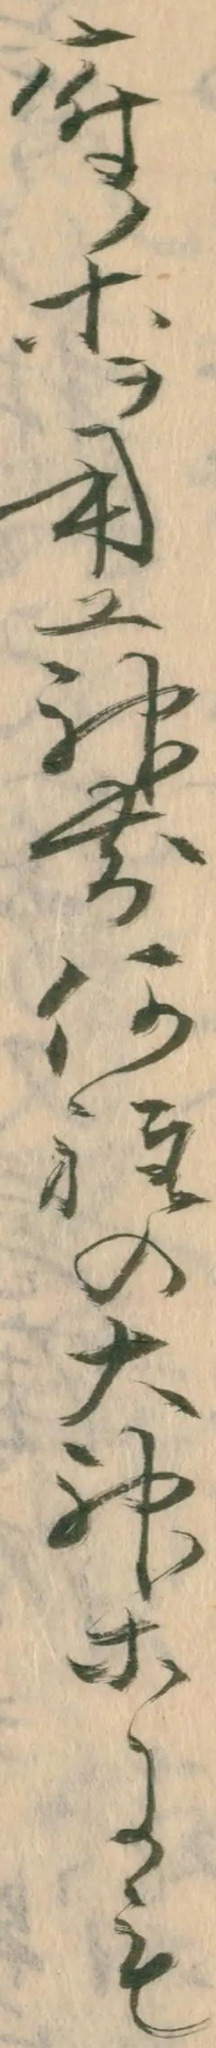府の等を用ゆ神前何程の大神等にも
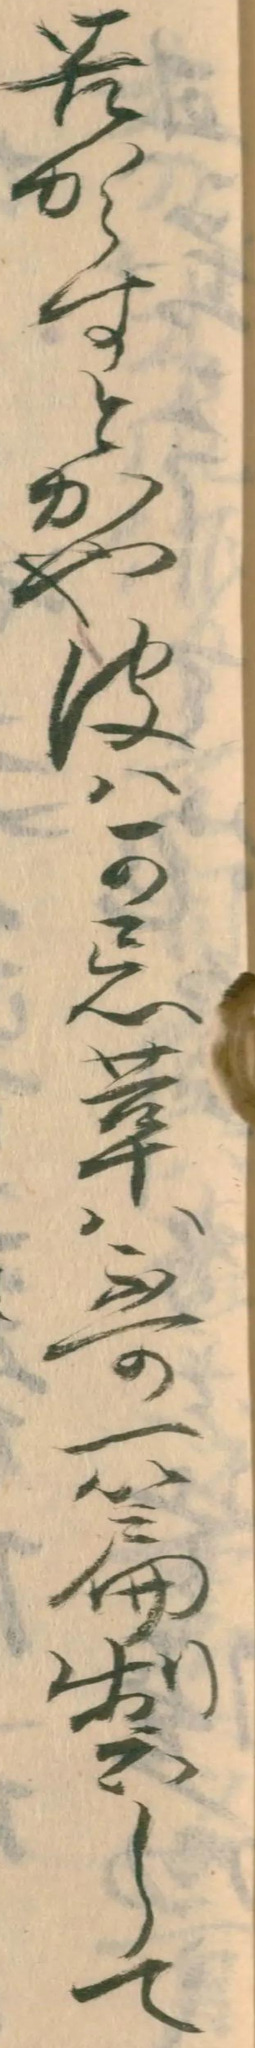苦からすとかや皮は可忌革は不可一篇製して
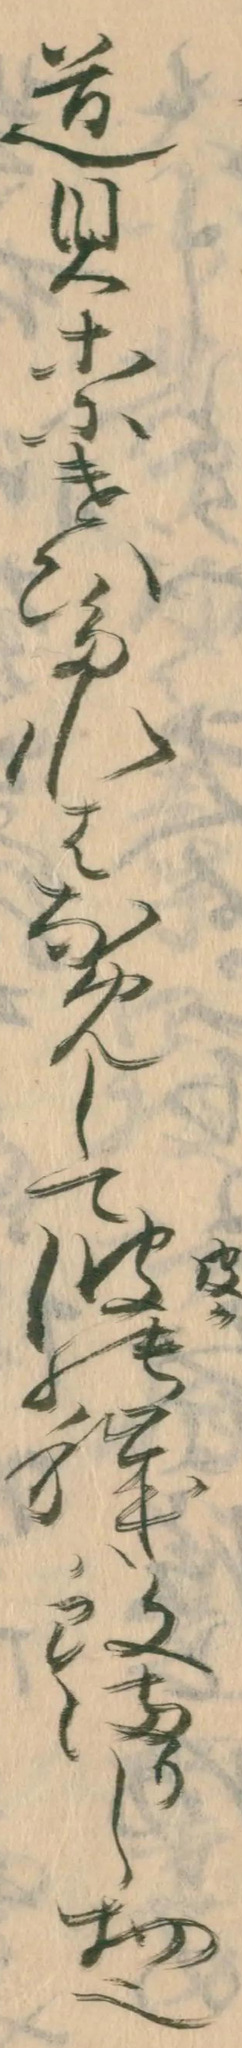道具等に遣ひたれはなめして波の穢は改まりし物也
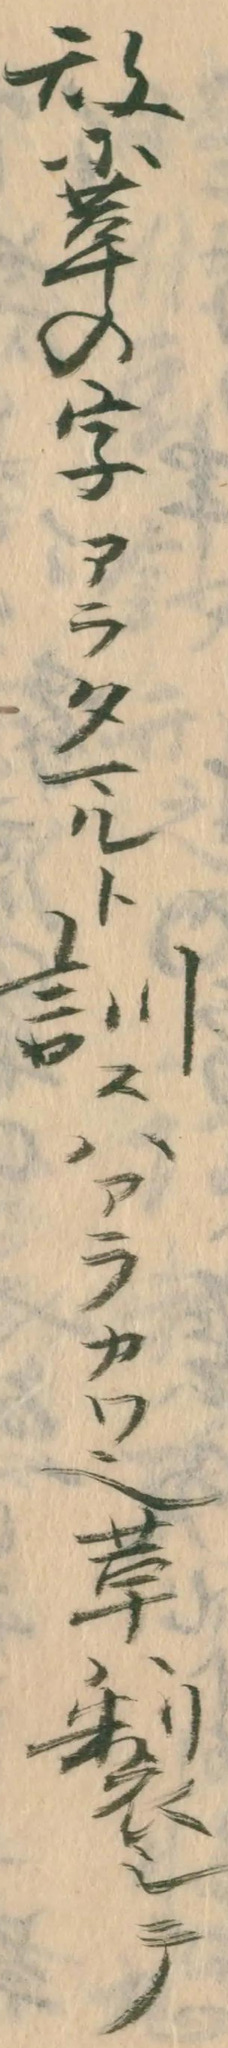故に革の字アラタマルと訓すはアラカワ也革は製して
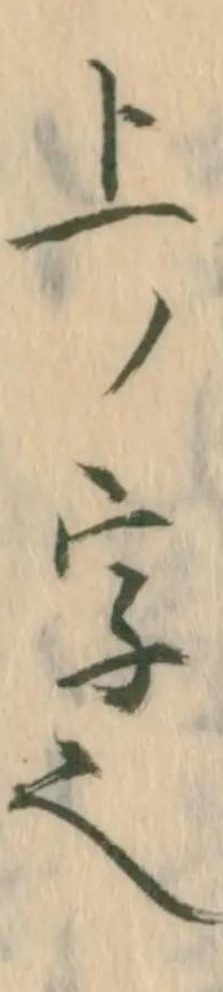上の字也
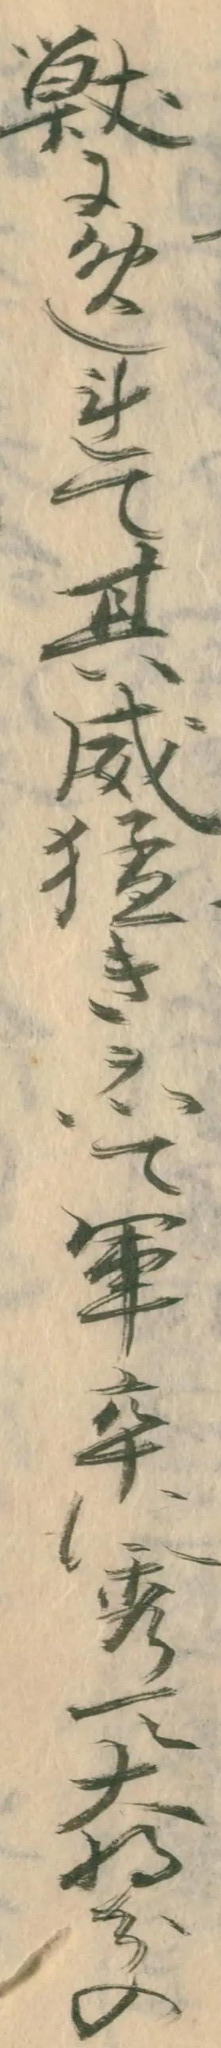獣に逸れて其威猛きを以て軍卒に秀て大将分の
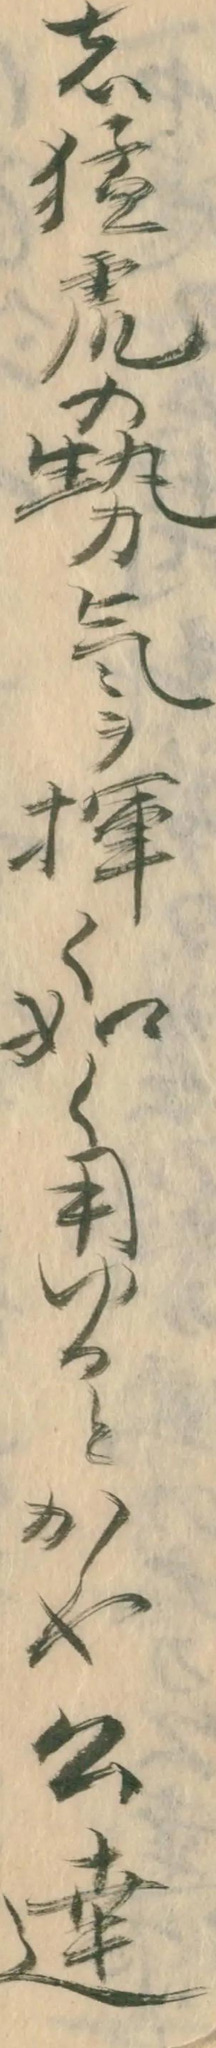者猛虎の勢気を揮く如く用ゆるとかや公達
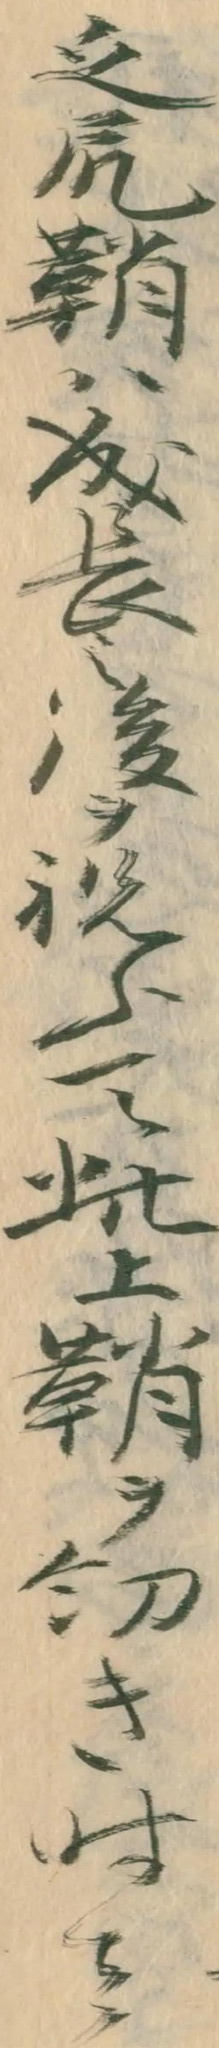之尻鞘は成長之後を祝ふて此上鞘を幼き時に

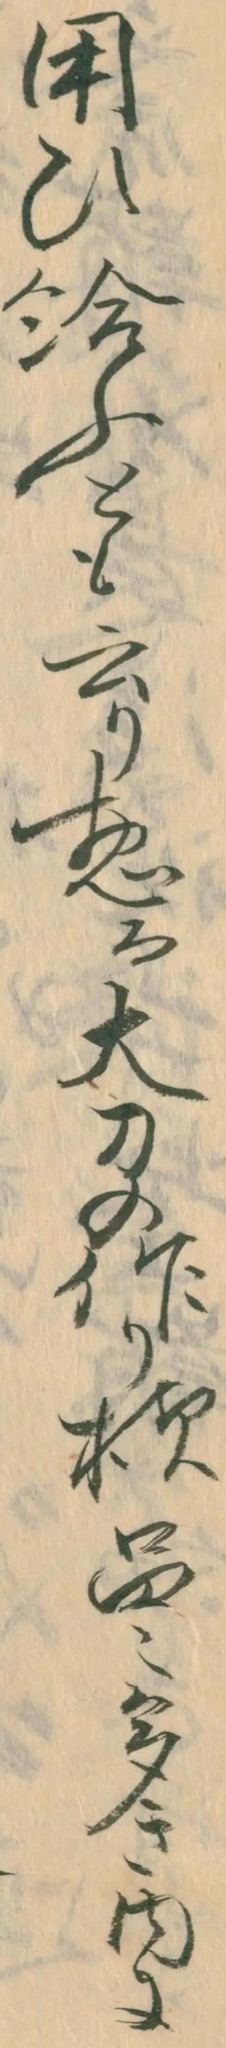用ひ給ふとも云り惣而大刀の作り様品々多き内に
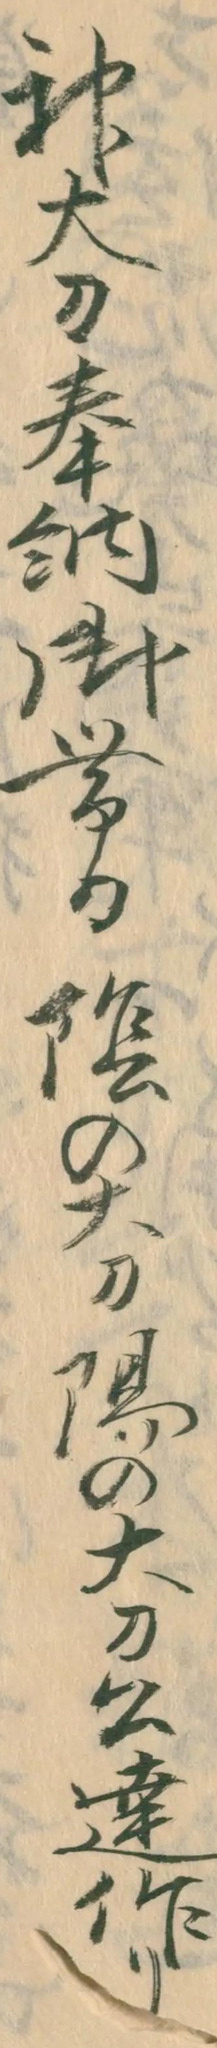神大刀奉納御帯刀陰の大刀陽の大刀公達作り
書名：賀茂社記録. 第12冊
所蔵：国立国会図書館 National Diet Library, JAPAN
